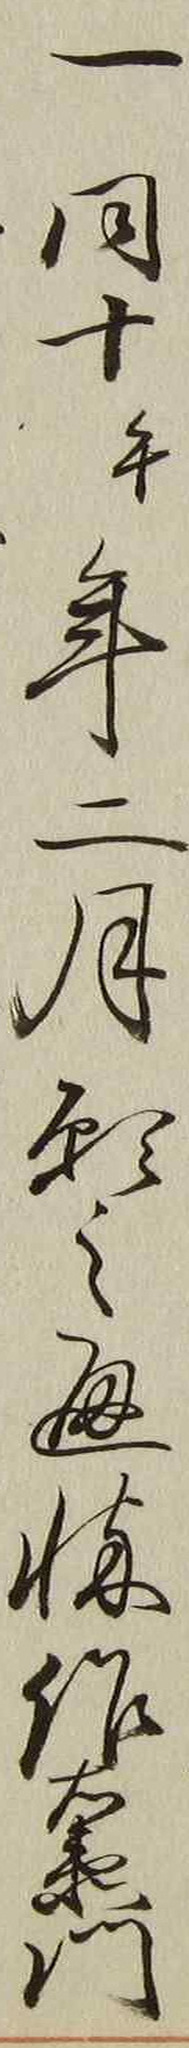一同十午年二月願之通忰作右衛門
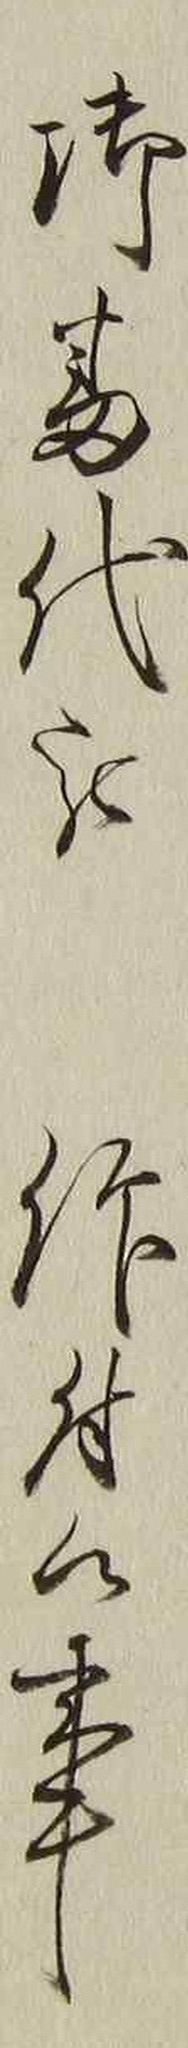御番代被仰付候事
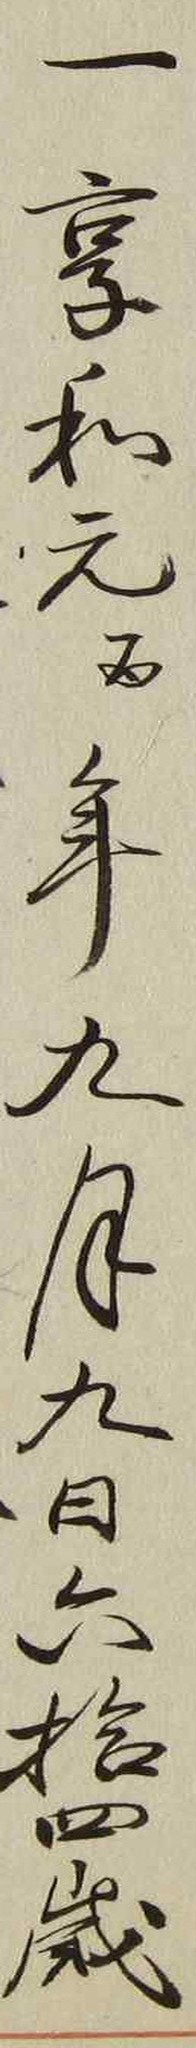一享和元酉年九月九日六拾四歳
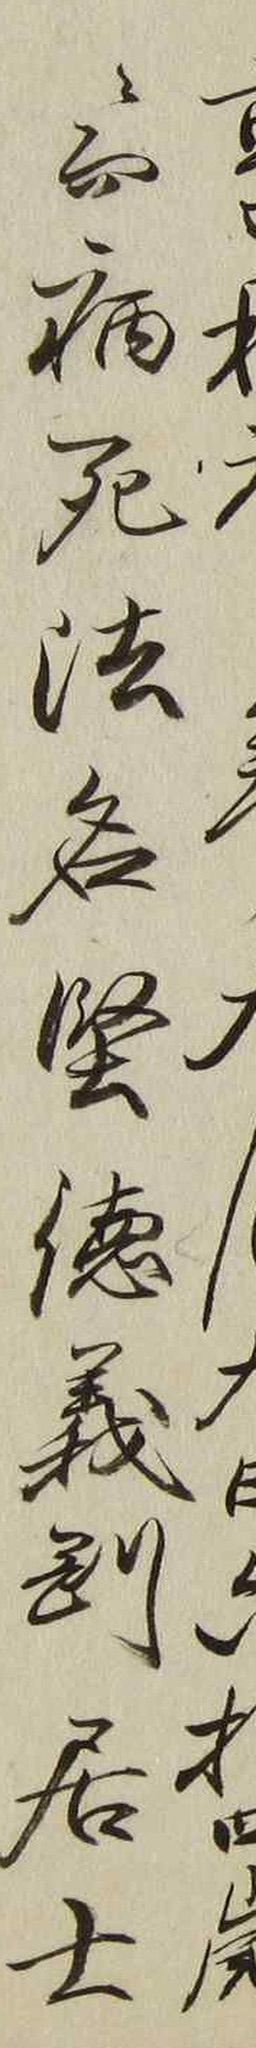ニ而病死法名堅徳義剛居士
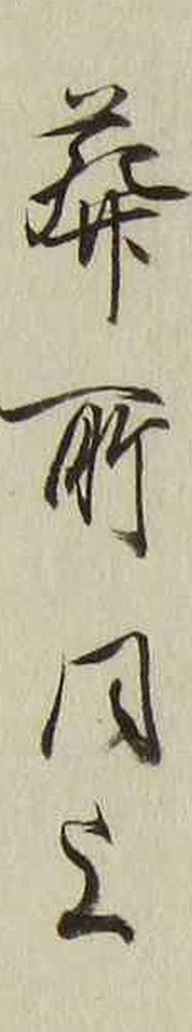葬所同上

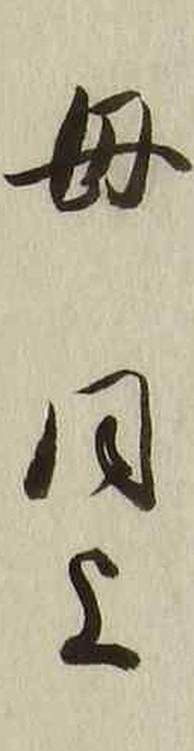母同上
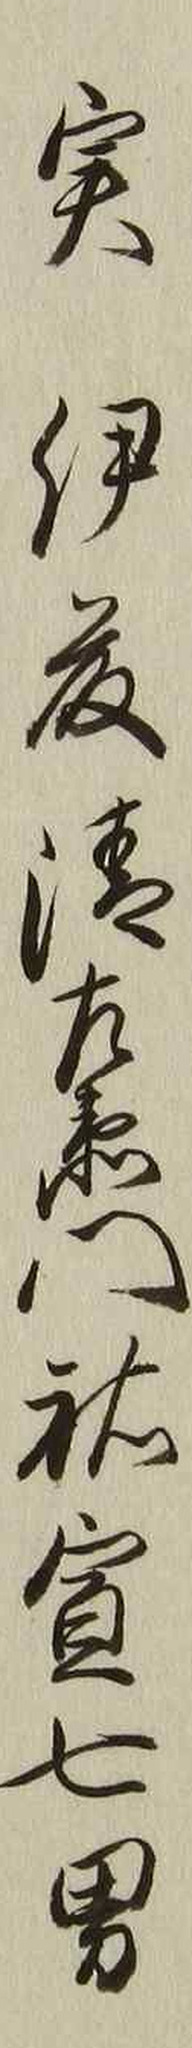実伊藤清左衛門祐宣七男
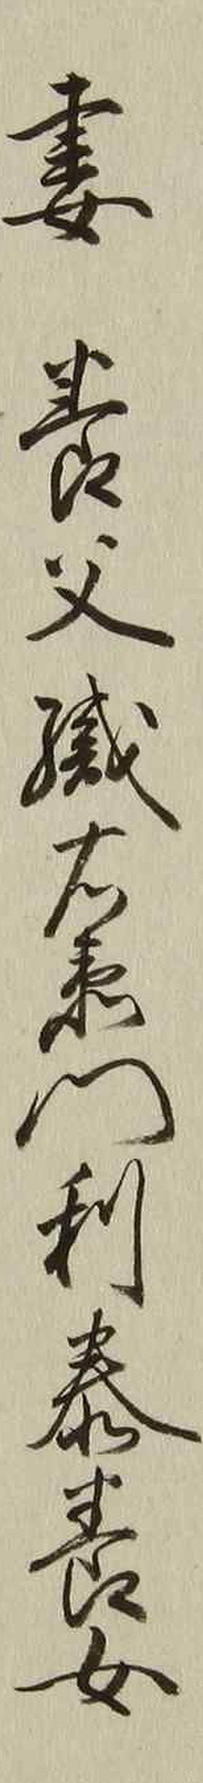妻養父職右衛門利泰養女
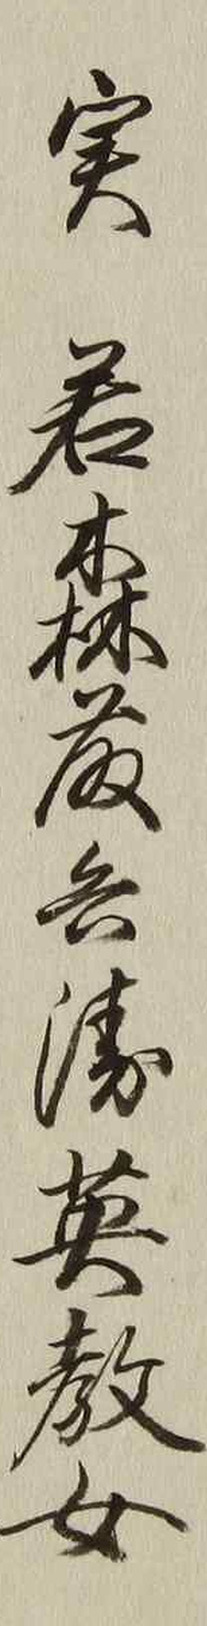実若森藤兵衛英教女
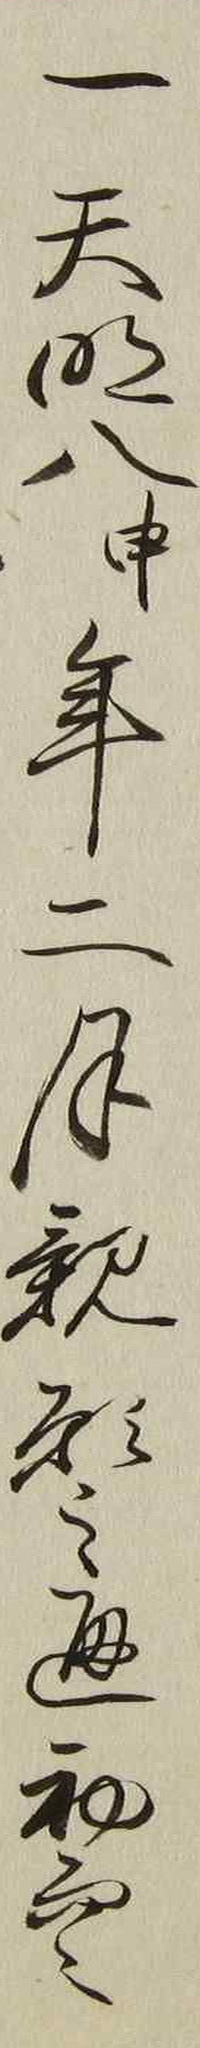一天明八申年二月親願之通初而之
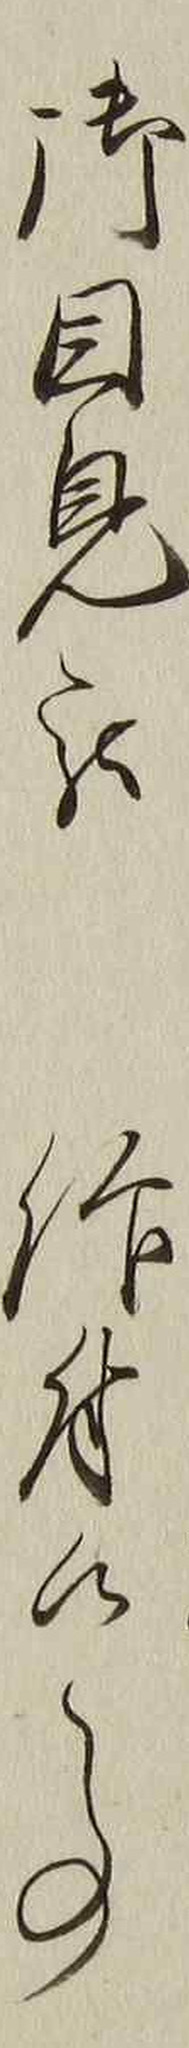御目見被仰付候事
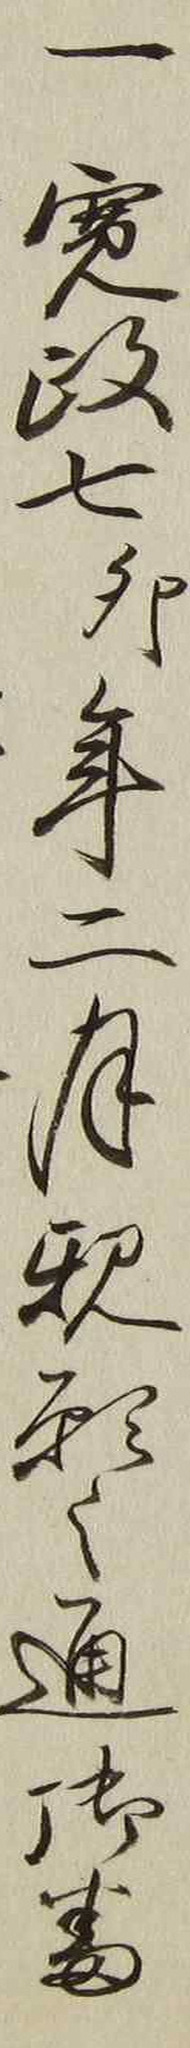一寛政七卯年二月親願之通御番
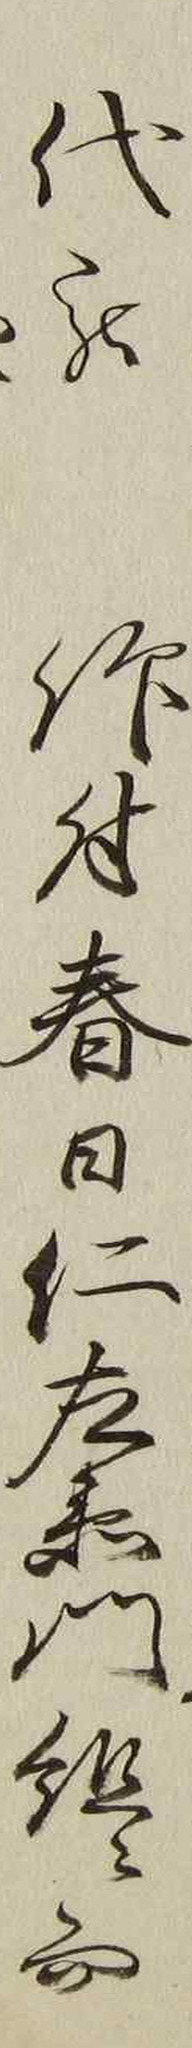代被仰付春日仁左衛門組ニ而
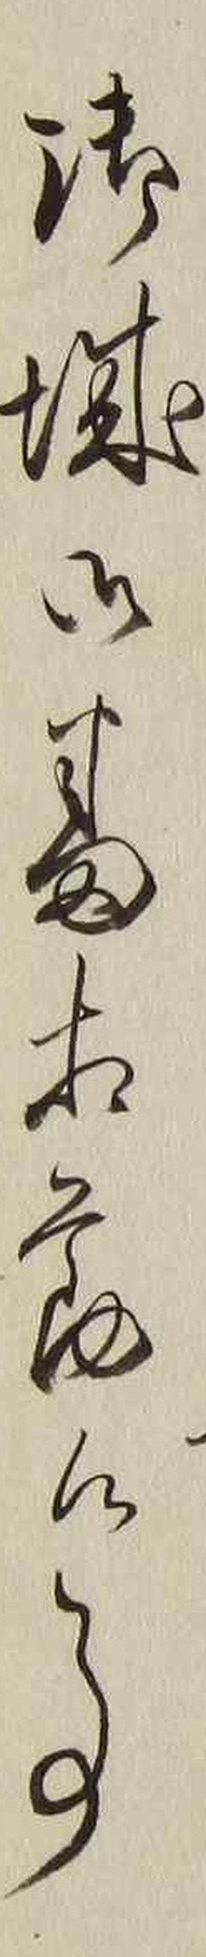御城御番相勤候事
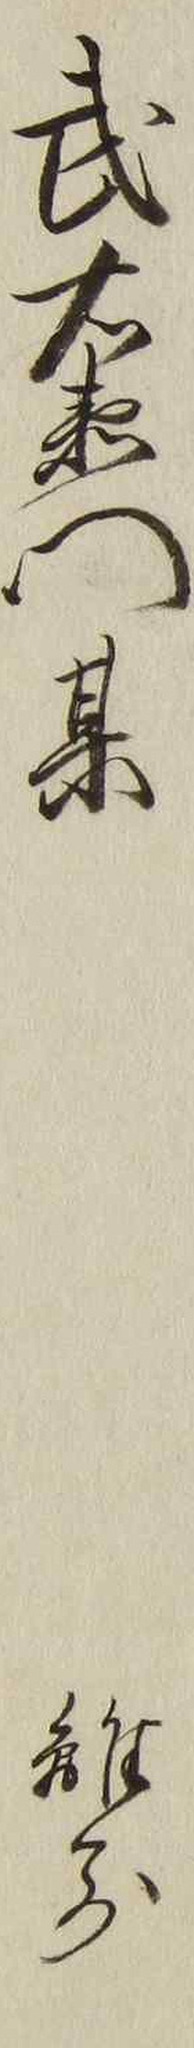武左衛門某離別

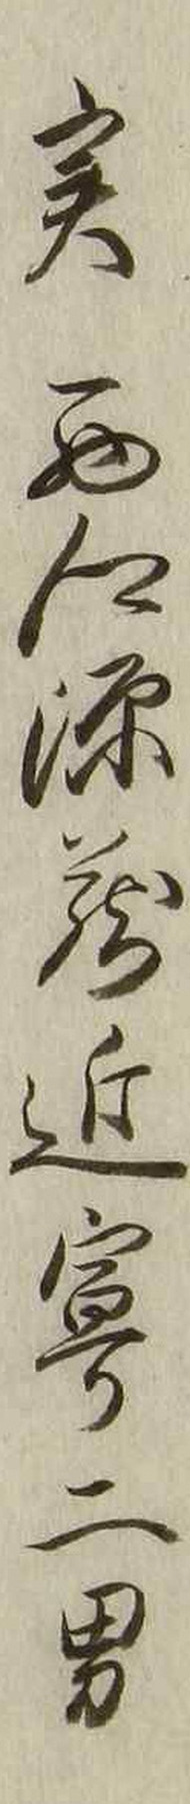実西郷源蔵近寧二男
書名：諸士系譜　巻之54　ほ之部1
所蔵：会津若松市立会津図書館
